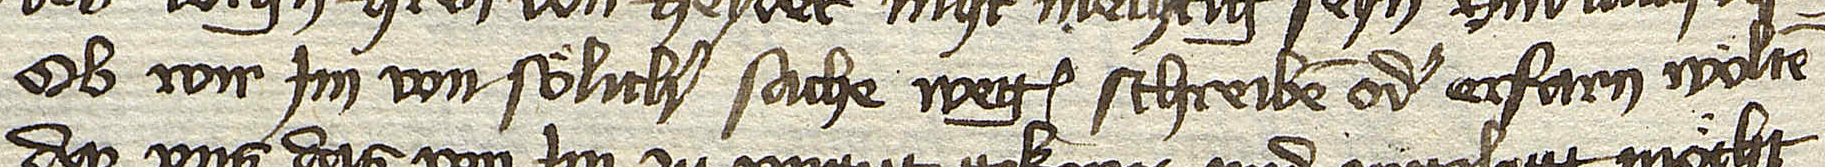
Ob wir Im von ſölich* ſache weg* ſchreibe* od* erfarn wölte*
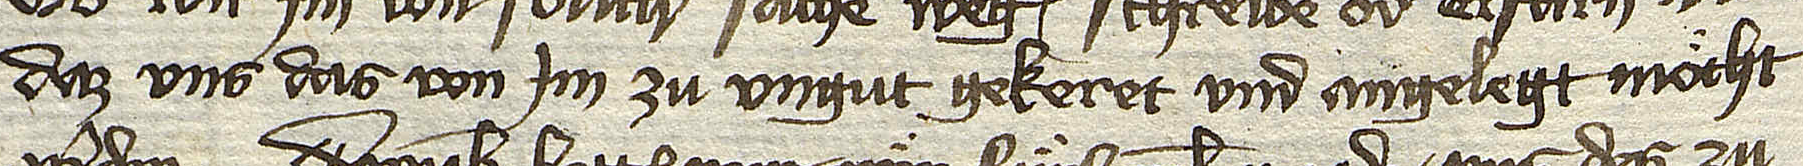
daʒ vns das von Im ʒu vngut gekeret vnd angelegt möcht
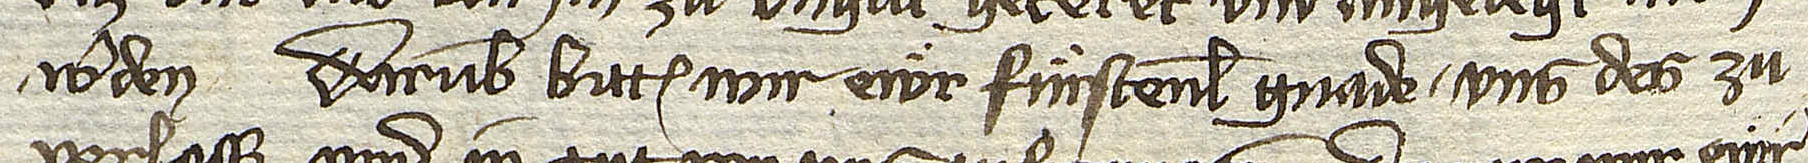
w*den Darub* bitt* wir ewr fürſtenl* gnade / vns des ʒu
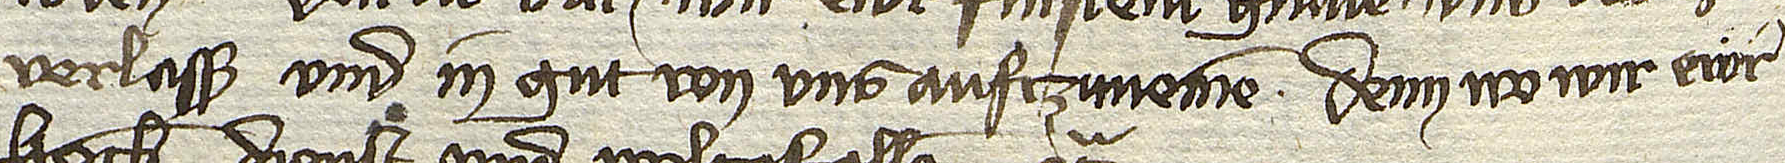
verlaſſ* vnd in gut von vns aufcʒuneme* . Denn wo wir ewr*
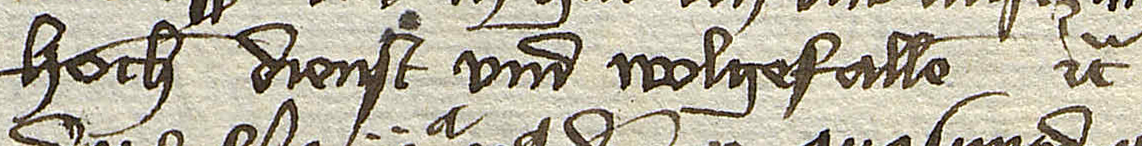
Hoch* dienſt vnd wolgefalle* ec*
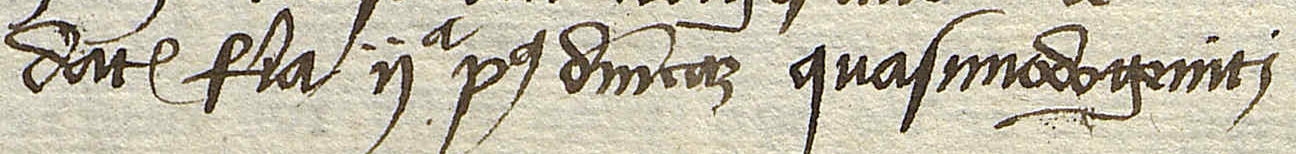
Dat* fi*a ii* p* dmca* quaſimodogeniti
